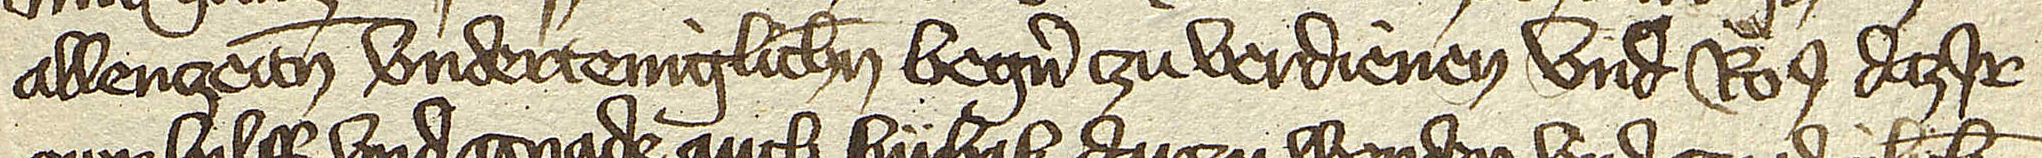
allencʒeitn* vnderteniglichn* begn* cʒ verdienen vnd Ro* daʒ Ir
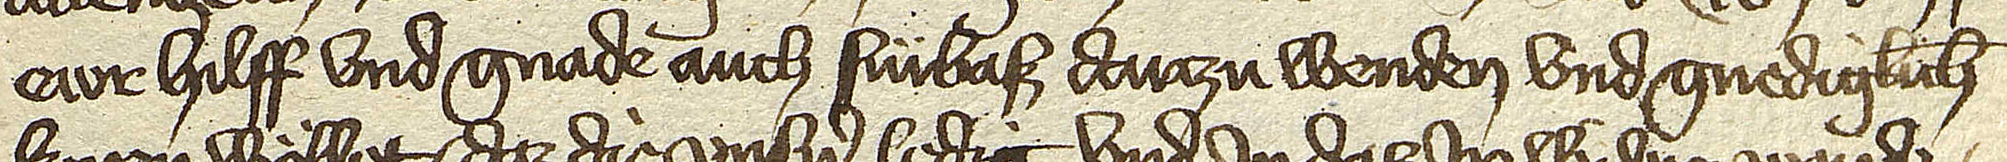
ewr hilff vnd gnade auch fürbaſʒ darcʒu wenden vnd gnediglich*
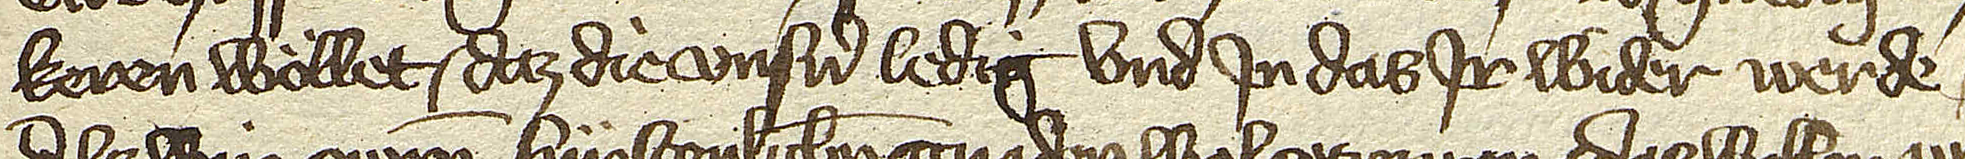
keren wöllet / daʒ die vnſn* ledig vnd In das Ir wider werde
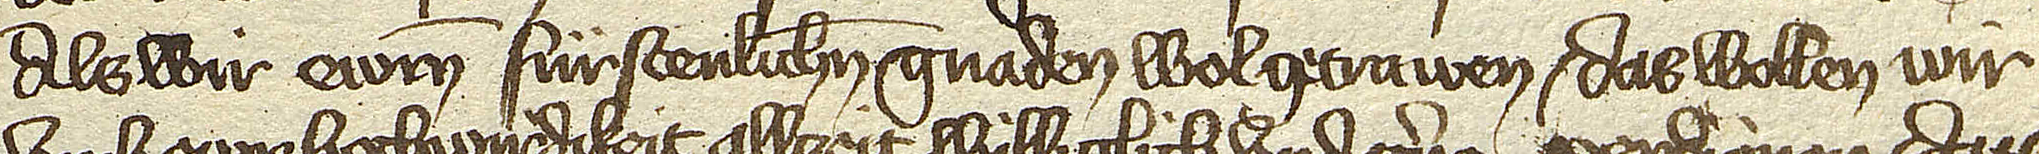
Als wir ewrn* fürſtenlichn* gnaden wol getrawen / das wollen wir
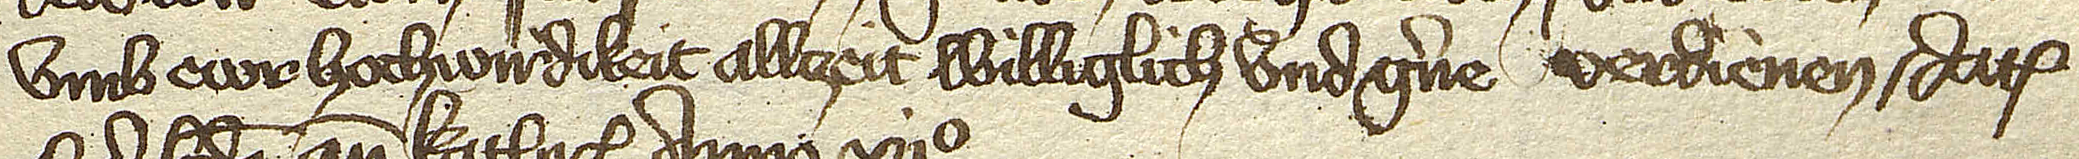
vmb ewr hochwirdikeit allcʒeit williglich vnd g*ne verdienen / dat*
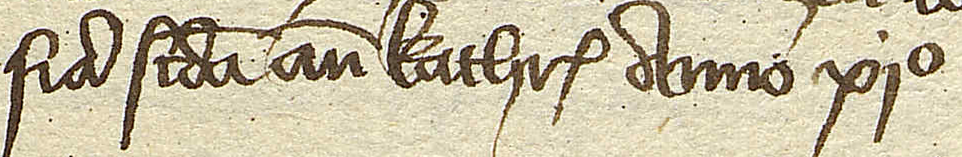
fia* ſcda* an* kathr* Anno xi*
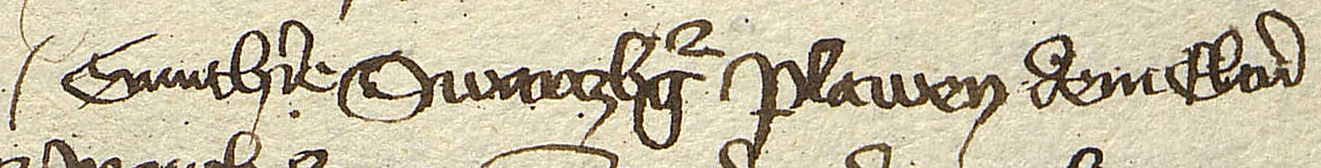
Gunthr*e Swarcʒb*g Plawen dem Eltn*
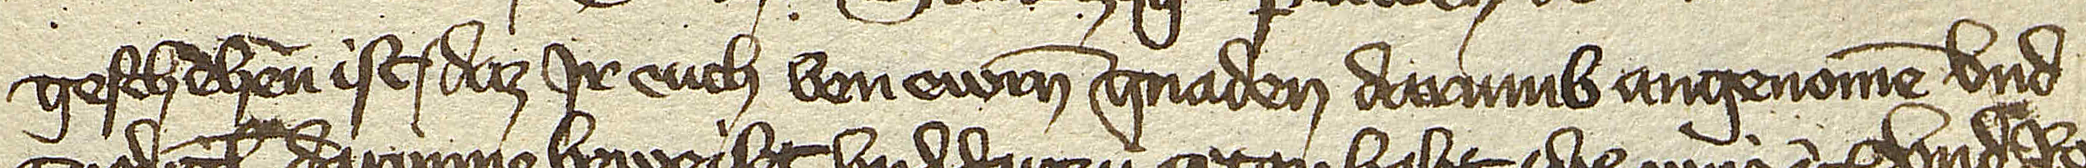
geſchehen iſt / daʒ Ir euch von ewrn* gnaden darumb angenome* vnd
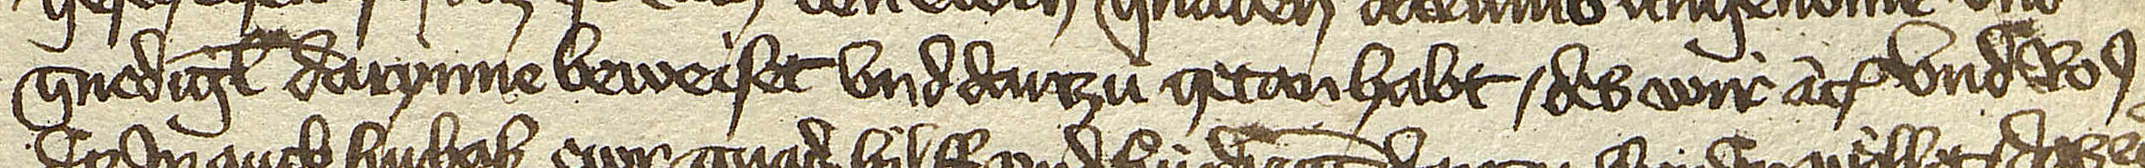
gnedigl* darynne beweiſet vnd darcʒu getan habt / des wir ec* vnd Ro*
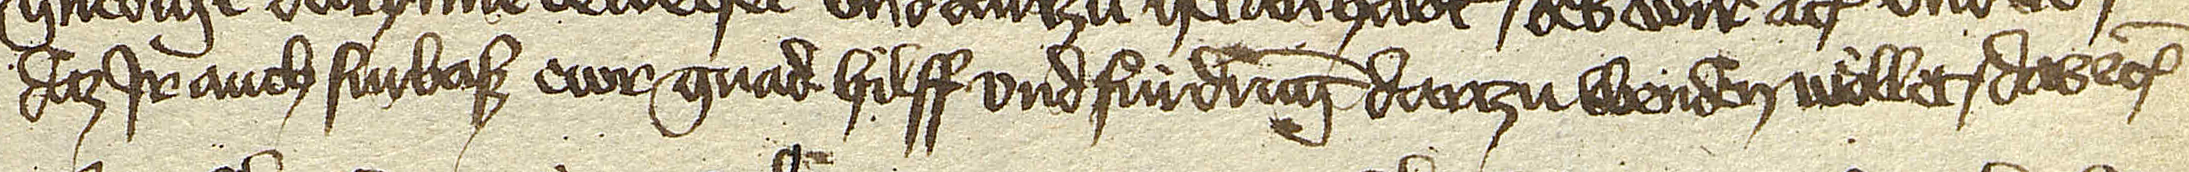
daʒ Ir auch furbaſʒ ewr gnad hilff vnd fürdrug* darcʒu wenden wöllet / das ec*
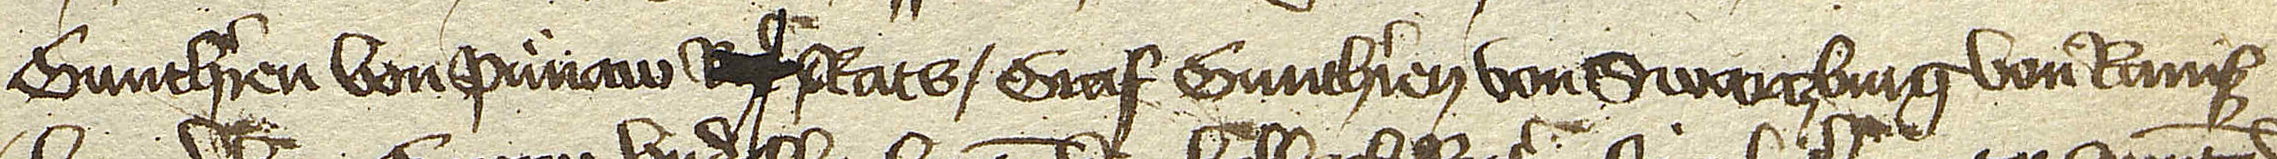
Gunthr*en von pünaw R%* Rats / Graf Gunthr*en von Swarcʒburg von Ramſʒ
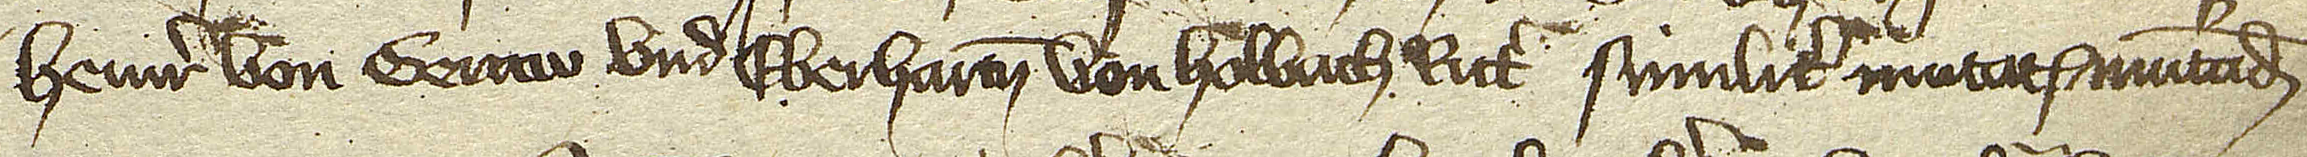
heinr* von Geraw vnd Eberhartn* von holbach Ritt* ſimilit* mutat* mutad*
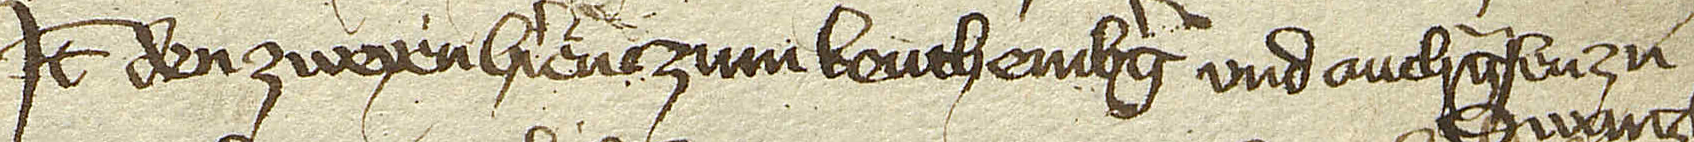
It den cʒweyen hr*en cʒum leuthembg* vnd auch g*fen ʒu
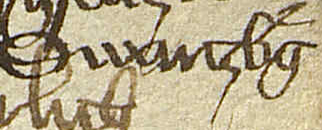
Swarcʒb*g
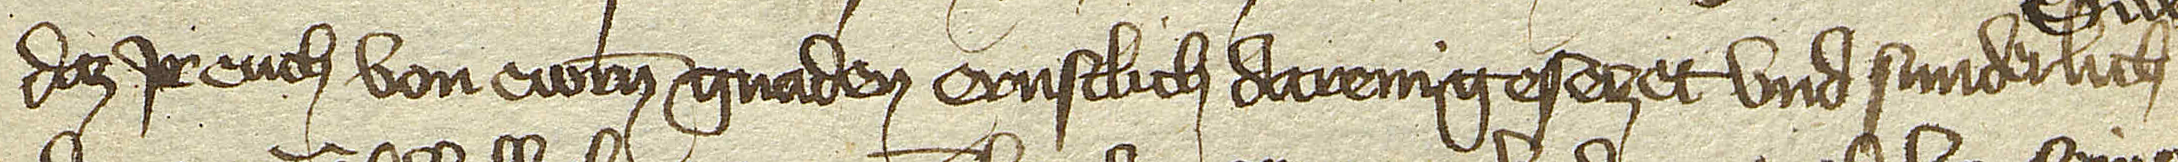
daʒ Ir euch von ewrn* gnaden ernſtlich darein geſecʒt vnd ſunderlich
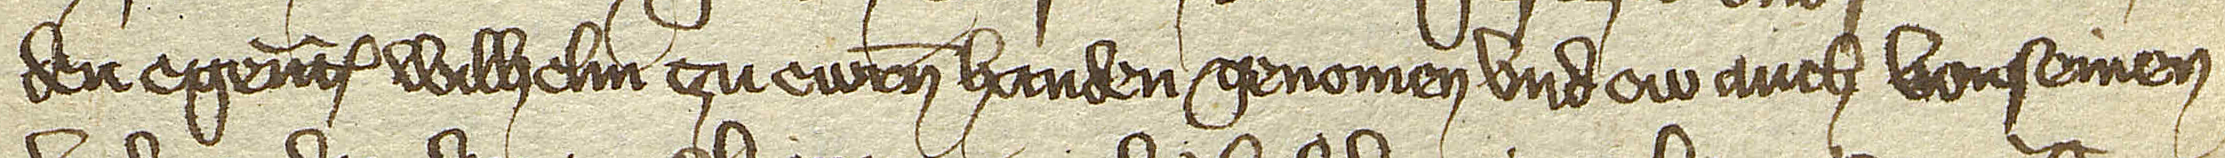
den egent* wilhelm cʒu ewrn* handen genomen vnd ew auch von ſeinen
